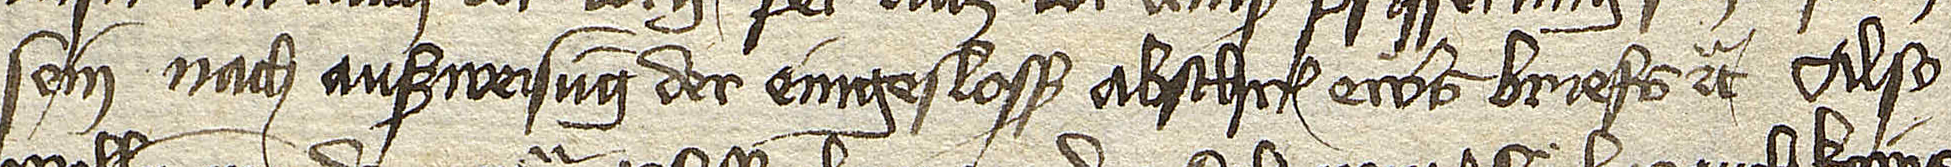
ſein nach auſʒweiſu*g der eingeſloſſ* abſchr* eẅ*s briefs ec* Alſo
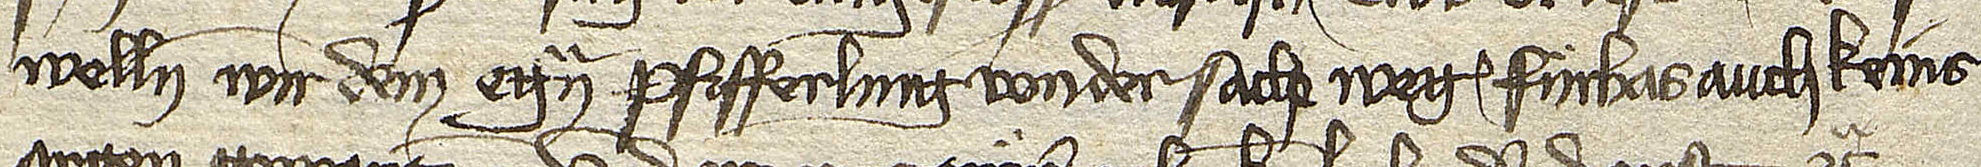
welln* wir dem egn* Pfifferling von der ſache weg* fürbas auch keins
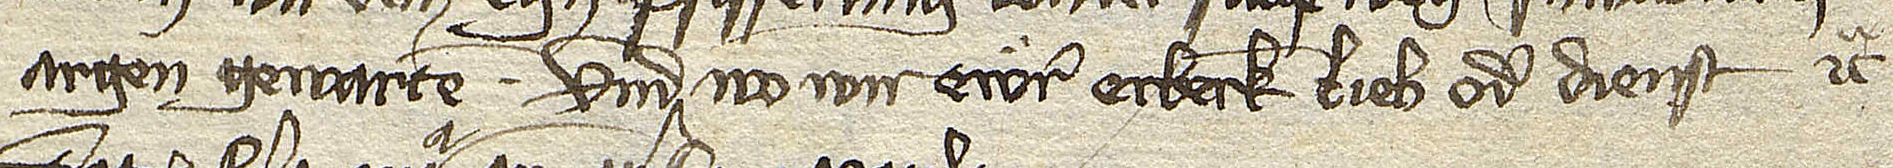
argen gewarte* . Vnd wo wir eẅr* erberk* lieb od* dienſt ec*
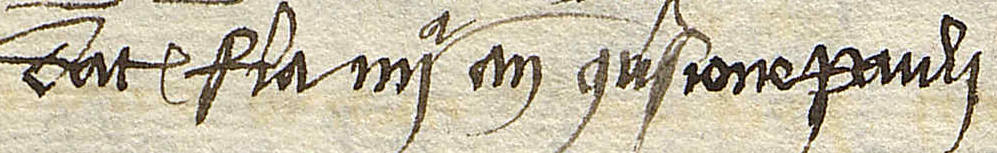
Dat* fi*a iiii* an* *u*ſione Pauli
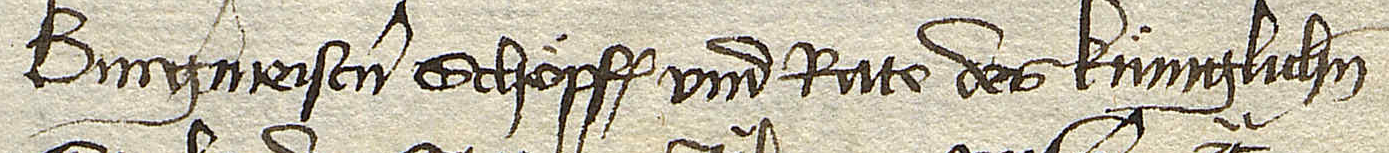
Burg*meiſtn* Schöpf* vnd Rate des küniglichn*
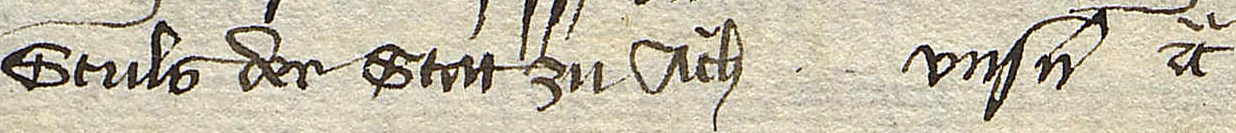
Stuls der Stat ʒu Ach vnſn* ec*
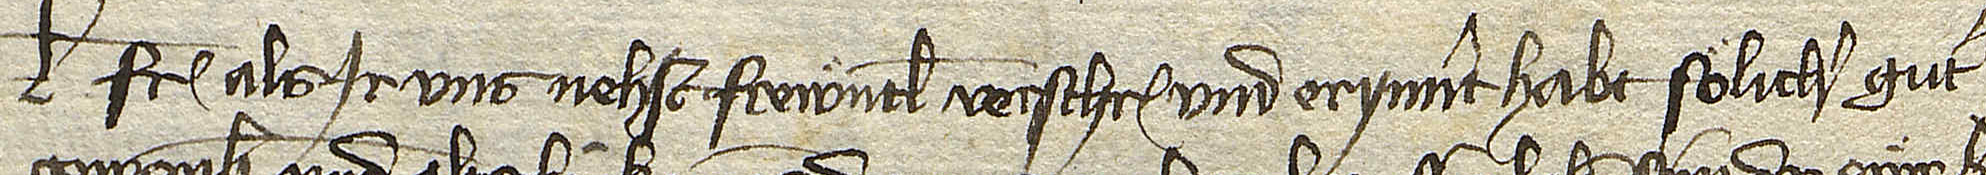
L* fr* als Ir vns nehſt freẅntl* verſchr* vnd erynn*t habt ſölich* gut*
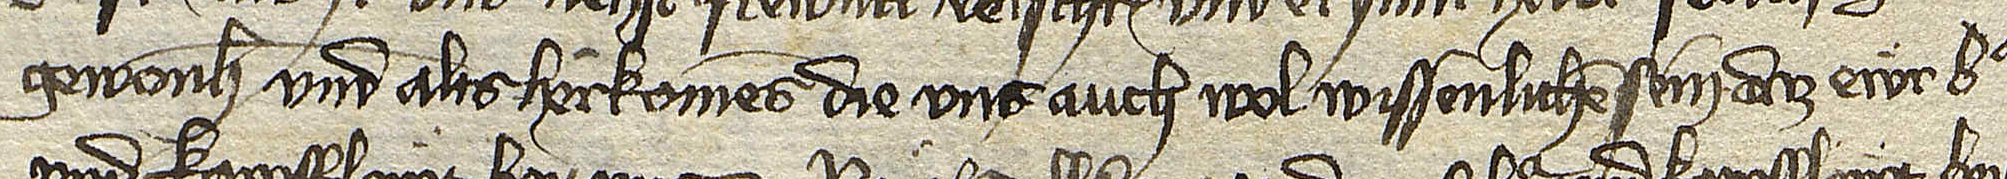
gewonh* vnd alts herkome*s die vns auch wol wiſſenliche* ſein daʒ eẅr b*
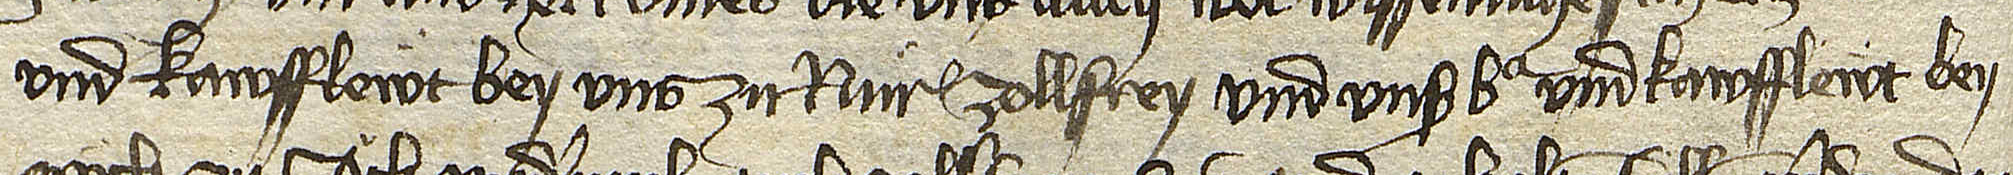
vnd kawffleẅt bey vns ʒu Nür* ʒollfrey vnd vnſ* b* vnd kawffleẅt bey
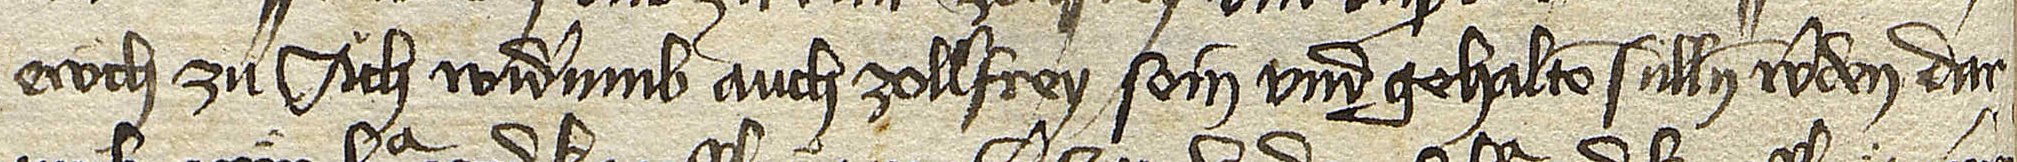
eẅch ʒu Ach wid*umb auch ʒollfrey ſein vnd gehalte* ſülln* w*den dar
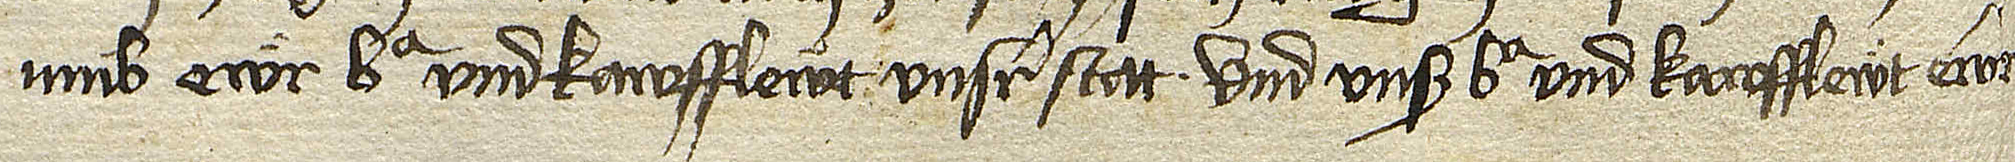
umb eẅr b* vnd kawffleẅt vnſr* ſtat . Vnd vnſ* b* vnd kawffleẅt ew*r
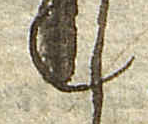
C
